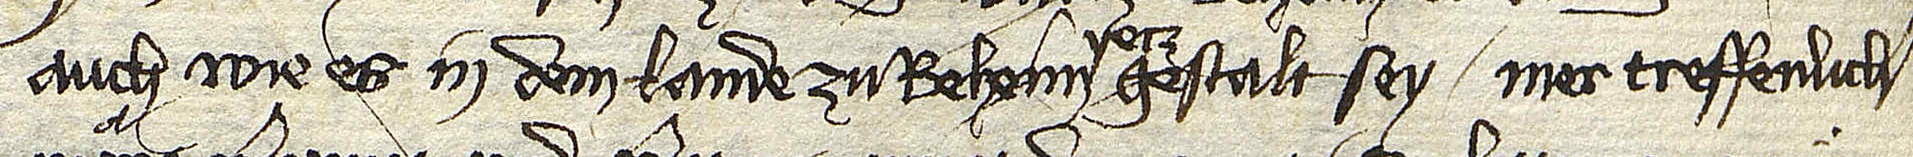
auch wie es in dem lande ʒu Beheim geſtalt ſey / mer treffenlich*
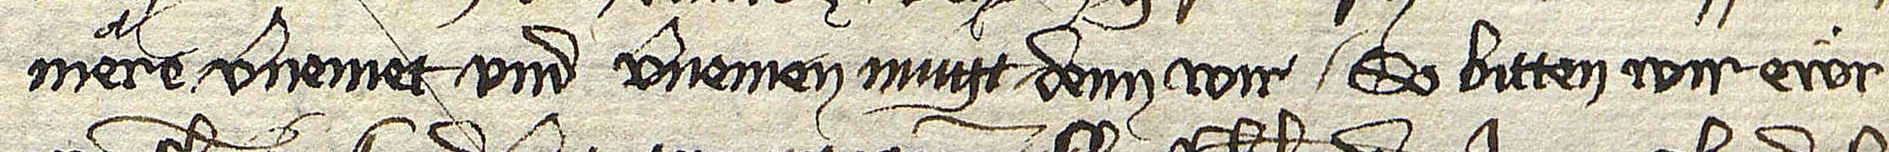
mëre v*nemet vnd v*nemen mugt / denn wir / So bitten wir ewr
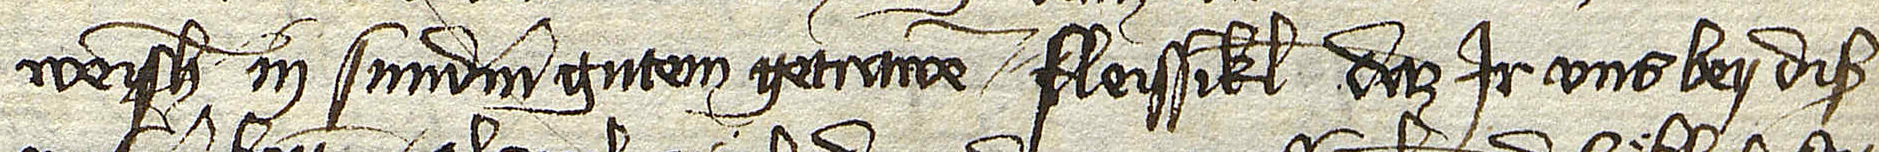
weiſh* in ſund*m gutem getrawe* / fleiſſikl* daʒ Ir vns bey diſ*
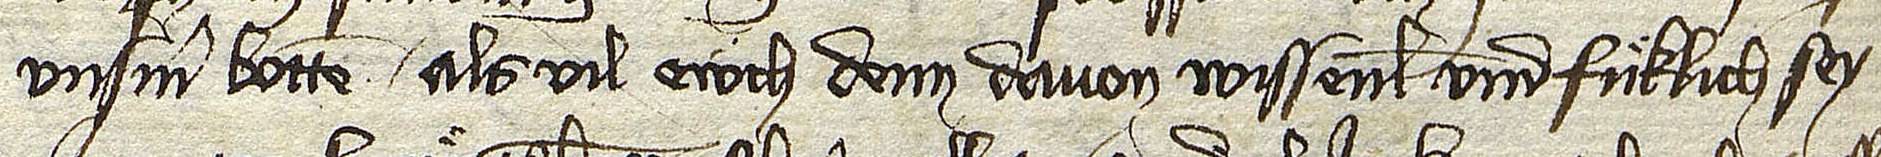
vnſ*m botte* / als vil ewch denn dauon wiſſenl* vnd füklich ſey
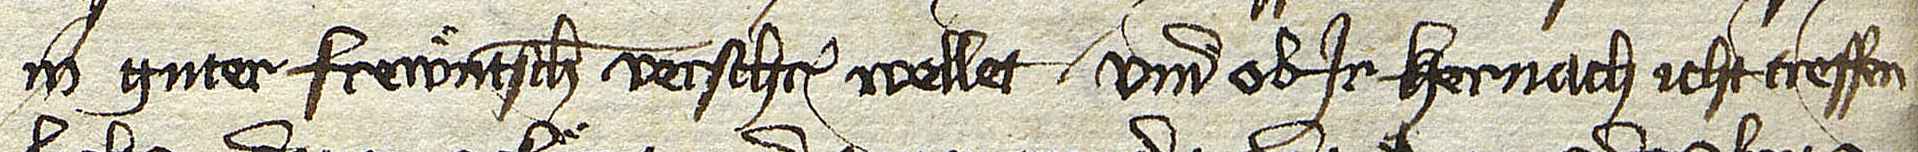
in guter frewntſch* verſchr* wellet / vnd ob Ir hernach icht treffen
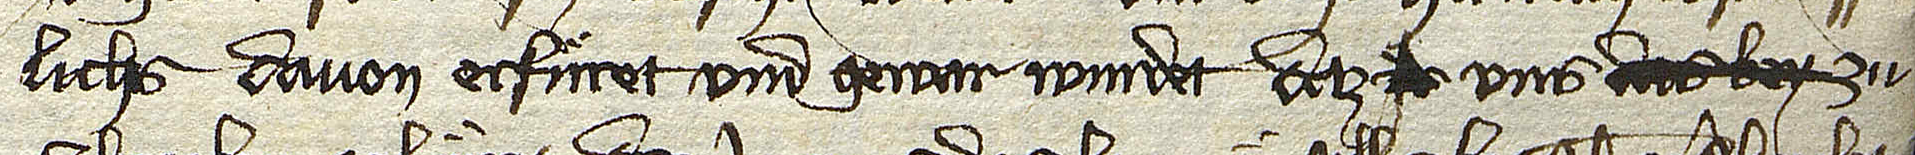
lichs dauon erfüret vnd gewar wurdet daʒ Ir vns das bey ʒu
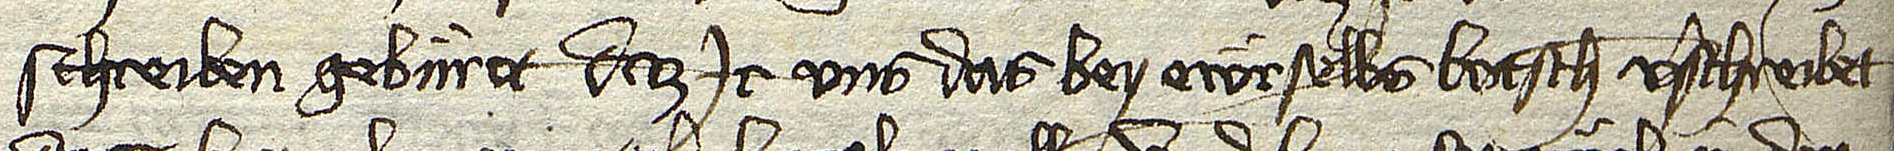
ſchreiben gebüret daʒ Ir vns das bey ewr ſelbs botſch* v*ſchreibet
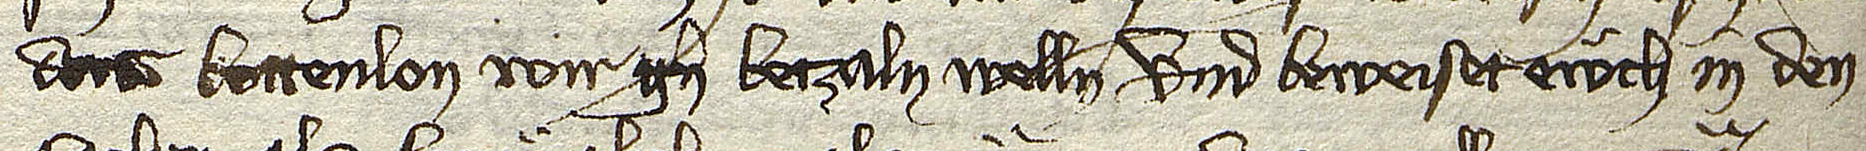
Das bottenlon wir g*n becʒaln welln* / Vnd beweiſet ewch in den
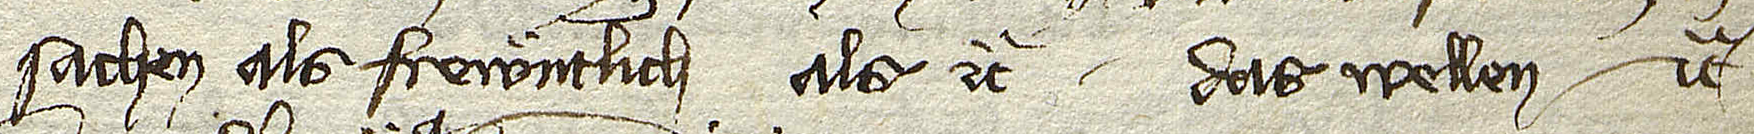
ſachen als frewntlich als ec* / das wellen ec*
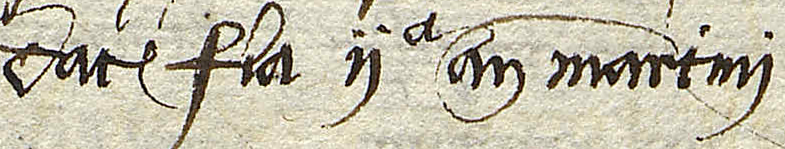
Dat* fia* ii* an* martinii
